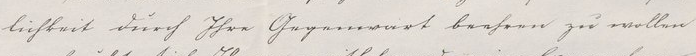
lichkeit durch Ihre Anwesenheit beehren zu wollen
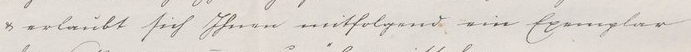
& erlaubt sich Ihnen mitfolgend ein Exemplar
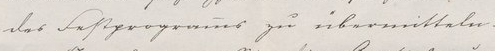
des Festprogramms zu übermitteln.
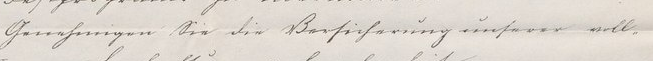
Genehmigen Sie die Versicherung unserer voll-
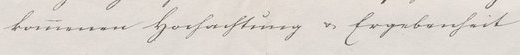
kommenen Hochachtung & Ergebenheit
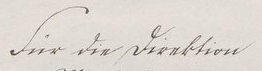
Für die Direktion
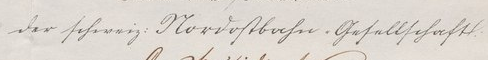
der schweiz: Nordostbahn-Gesellschaft:
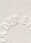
Dr
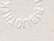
Escher
